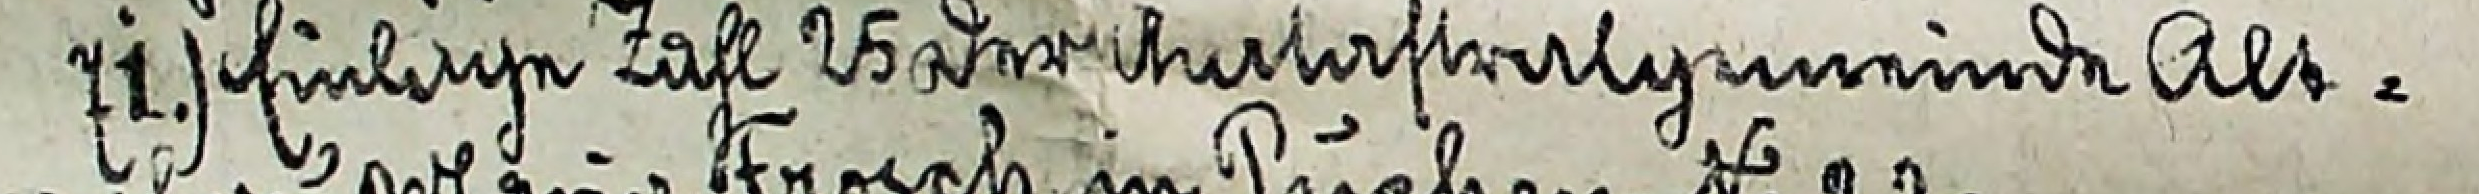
71.) Einlage Zahl 25 der Katastralgemeinde Alt=
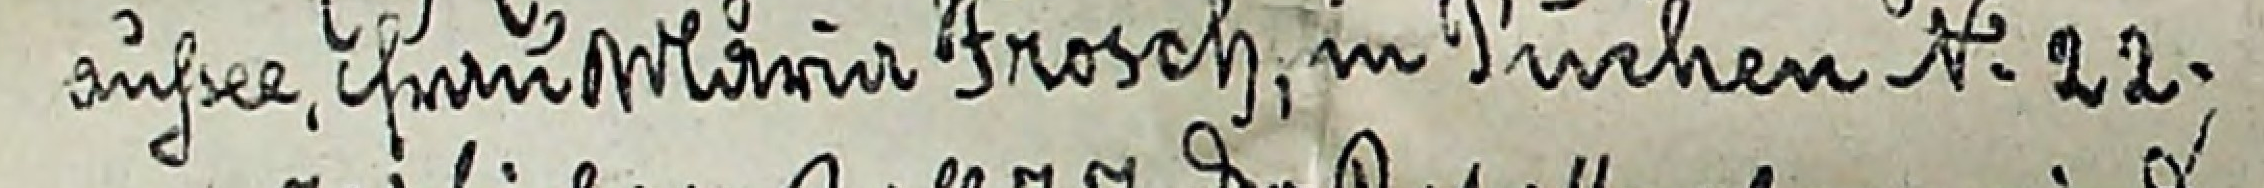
aussee, Frau Maria Frosch, in Puchen № 22;
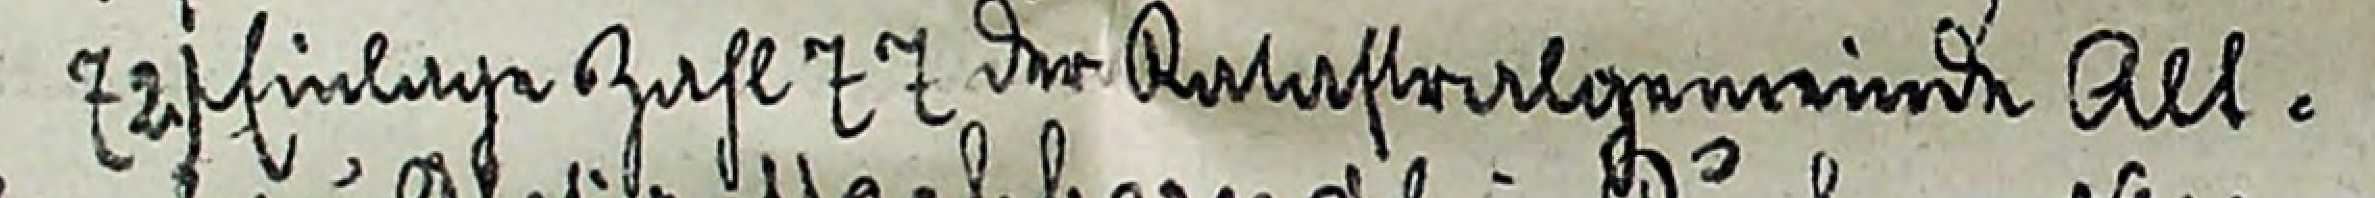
72.) Einlage Zahl 77 der Katastralgemeinde Alt=
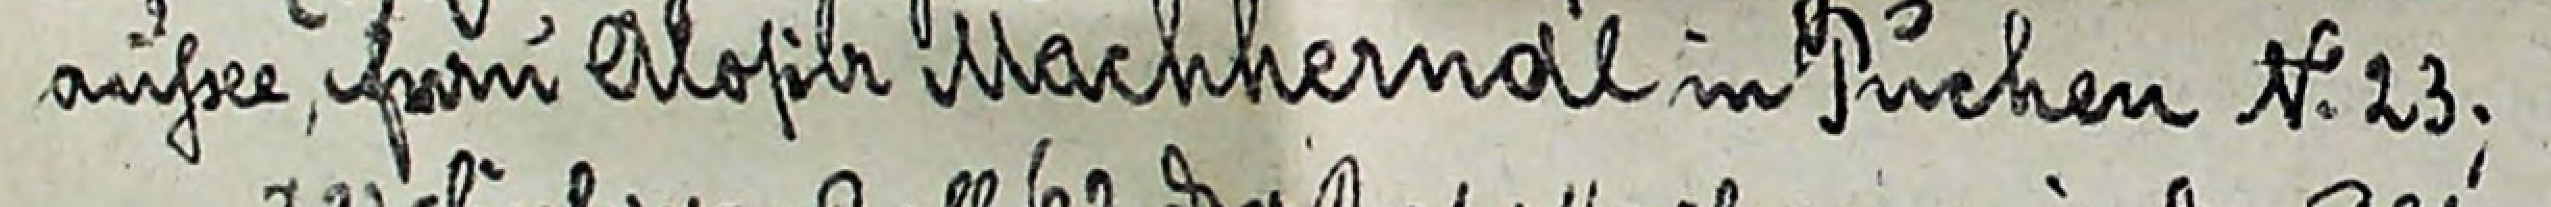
aussee, Frau Alosia Machherndl in Puchen № 23;
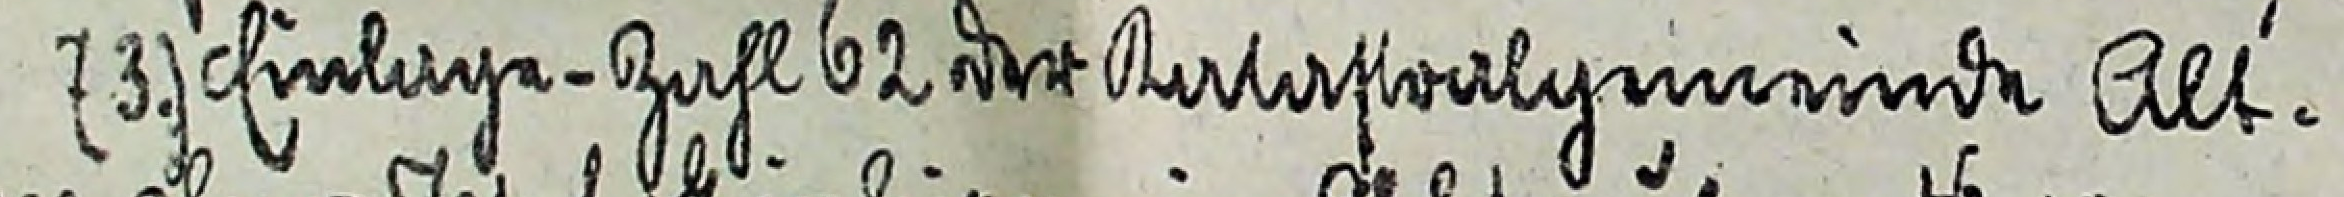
73.) Einlage - Zahl 62 der Katastralgemeinde Alt=
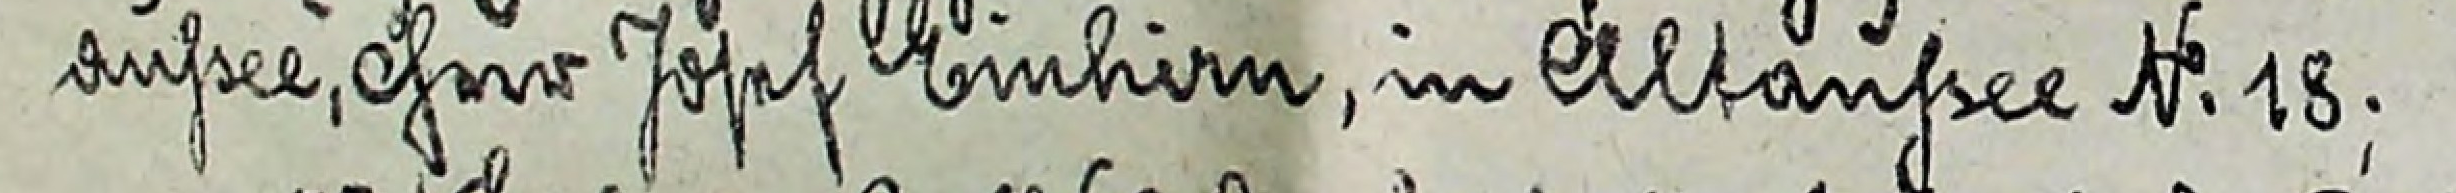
aussee, Herr Josef Einhirn, in Altaussee № 18;
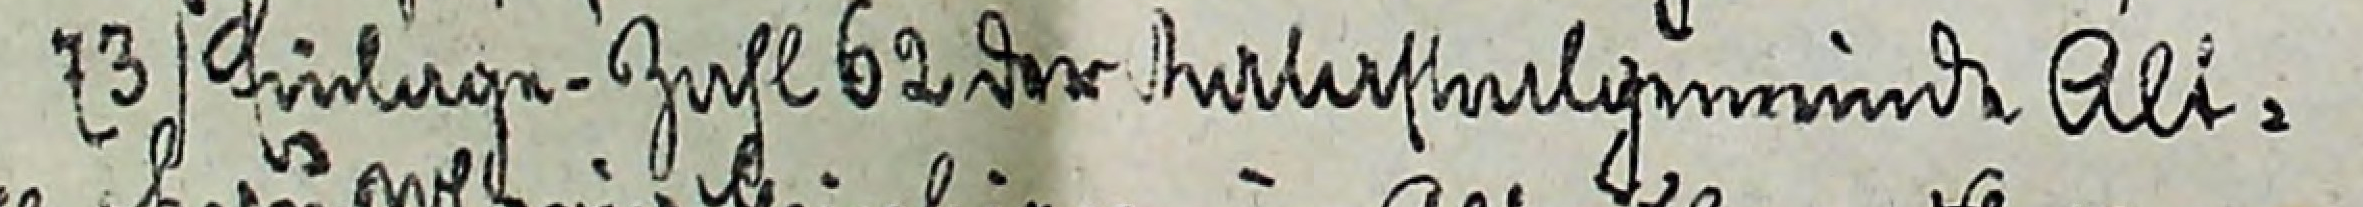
73) Einlage - Zahl 62 der Katastralgemeinde Alt=
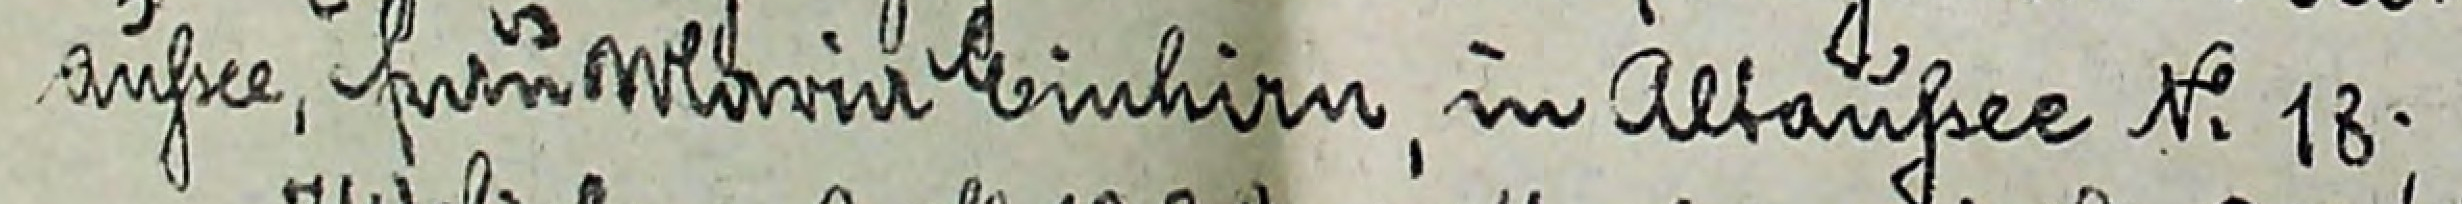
aussee, Frau Maria Einhirn, in Altaussee № 18;
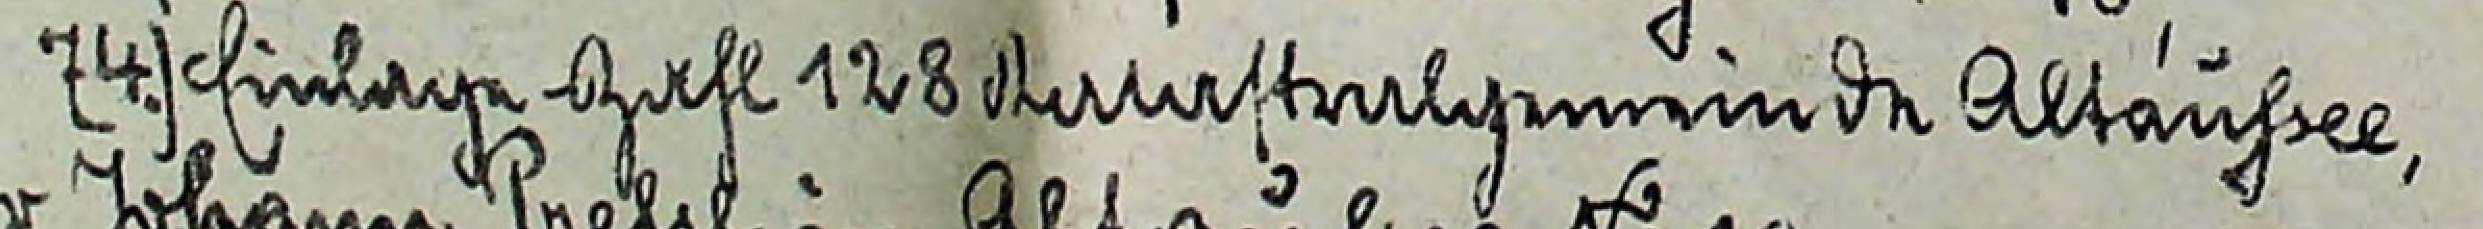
74.) Einlage - Zahl 128 Katastralgemeinde Altaussee,
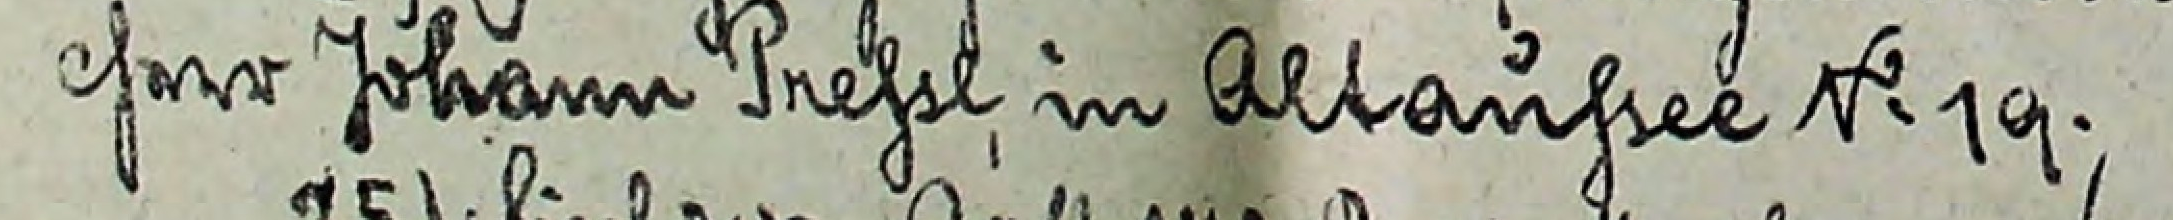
Herr Johann Pressl, in Altaussee № 19;
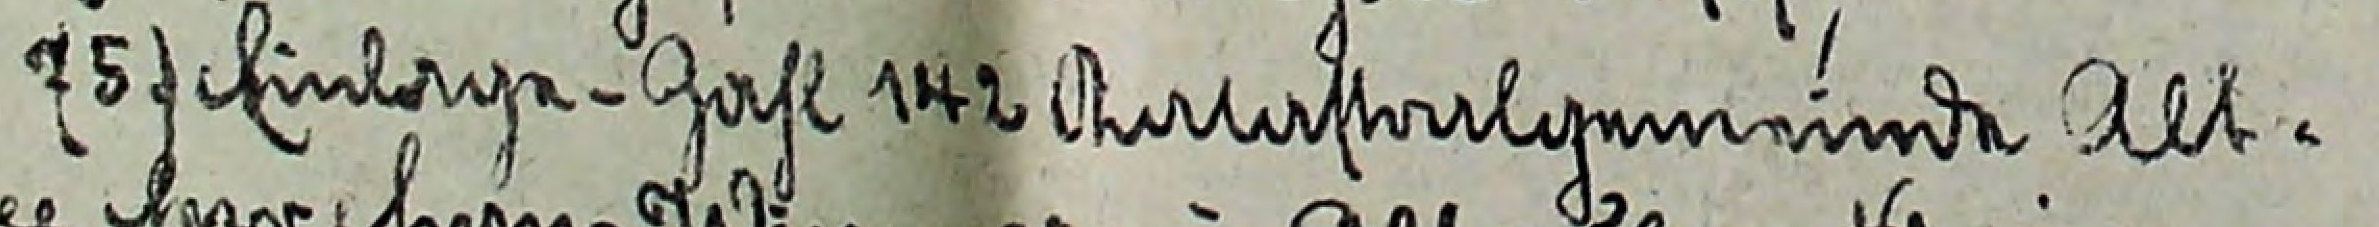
75.) Einlage - Zahl 142 Katastralgemeinde Alt=
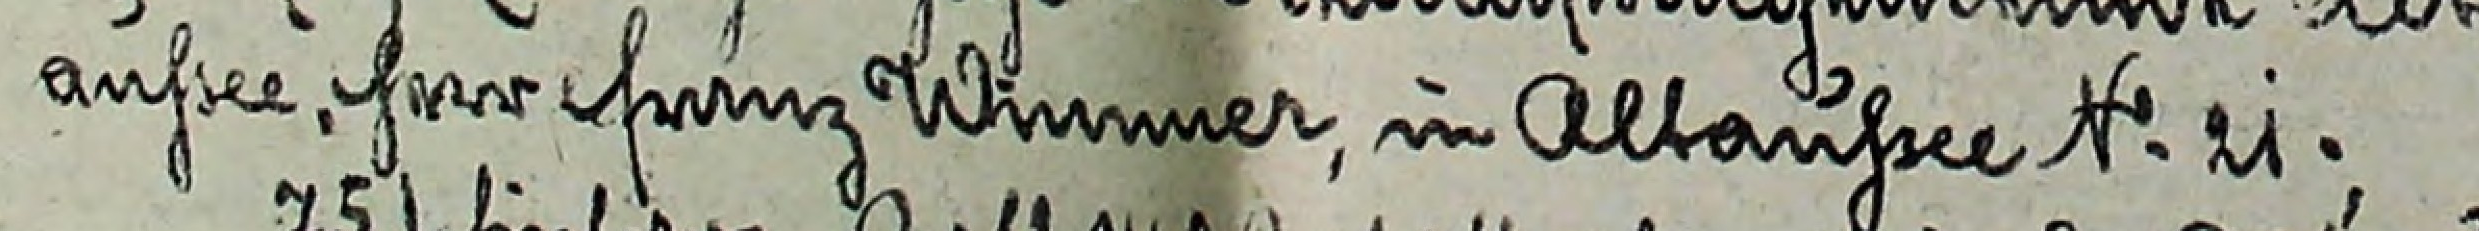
aussee, Herr Franz Wimmer, in Altaussee № 21;
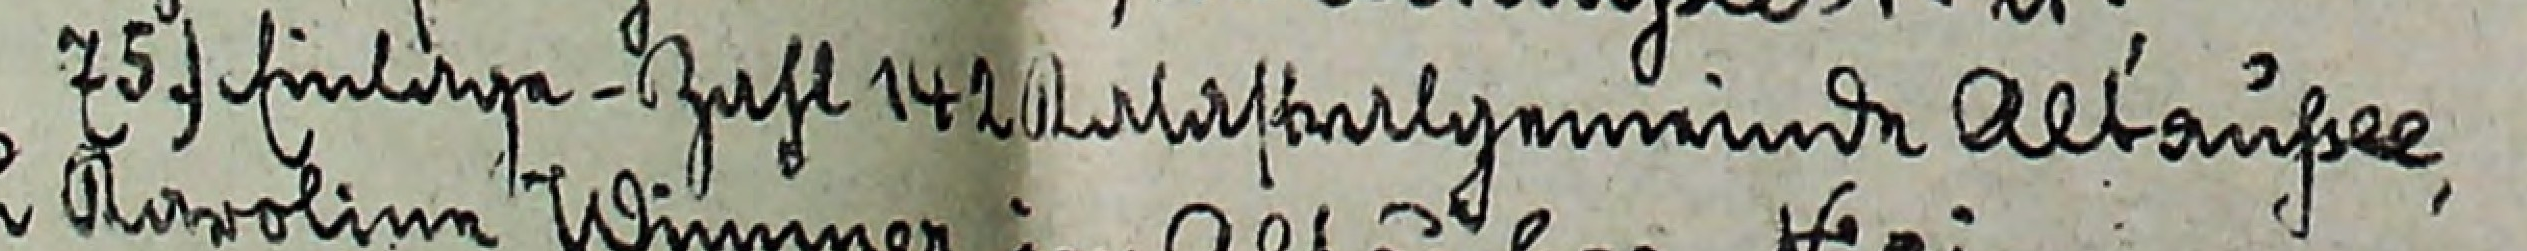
75.) Einlage - Zahl 142 Katastralgemeinde Altaussee,
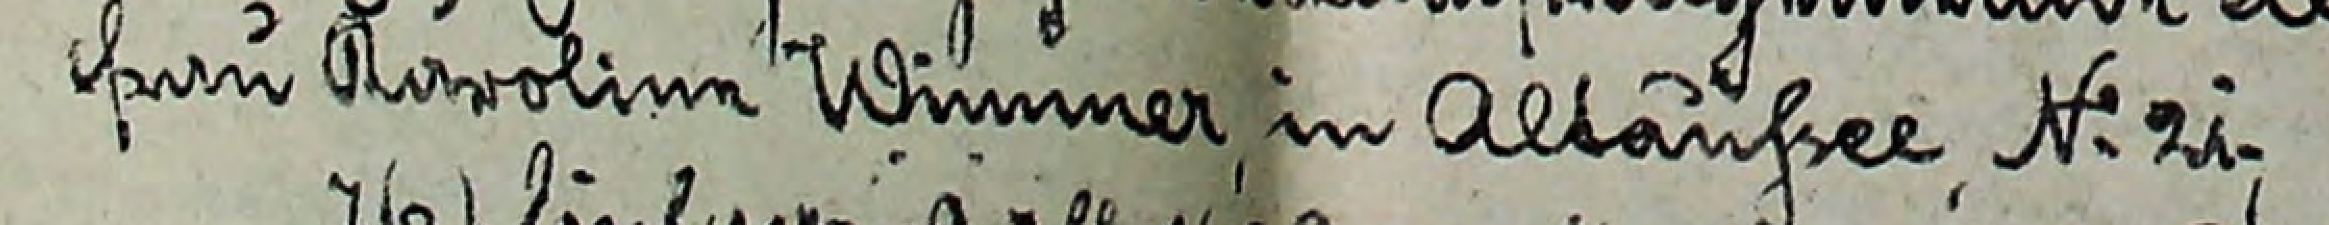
Frau Karoline Wimmer, in Altaussee, № 21;
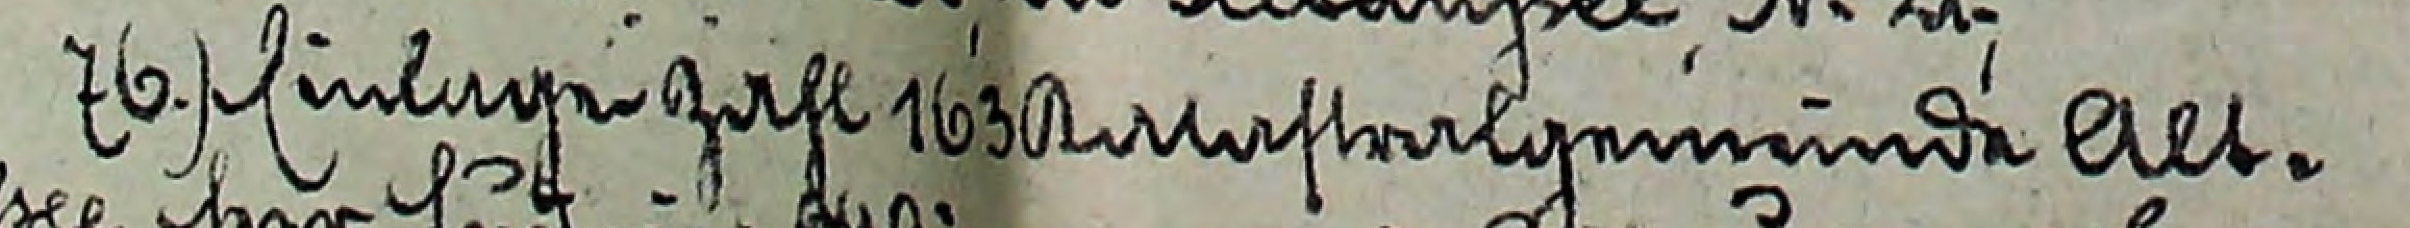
76.) Einlage Zahl 163 Katastralgemeinde Alt=
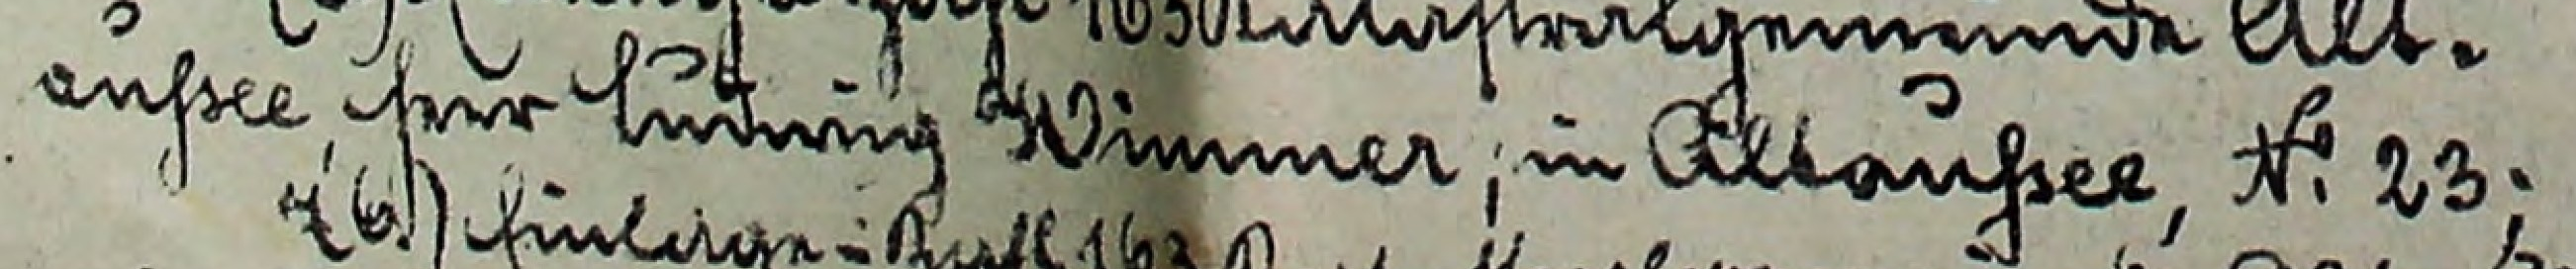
aussee, Herr Ludwig Wimmer, in Altaussee, № 23;
